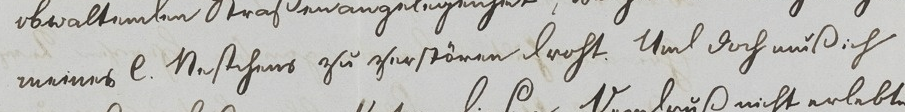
meines l. Nestchens zu zerstören droht. Und doch muß ich
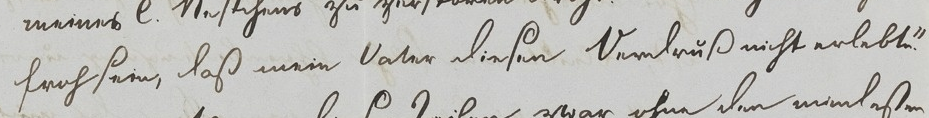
froh sein, daß mein Vater diesen Verdruß nicht erlebte.»
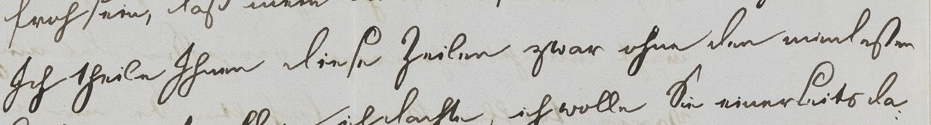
Ich theile Ihnen diese Zeilen zwar ohne den mindesten
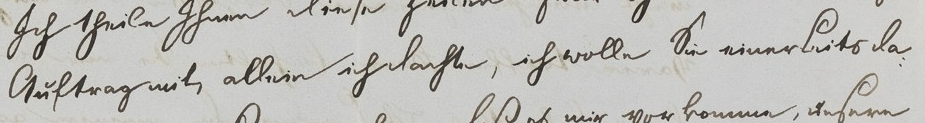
Auftrag mit, allein ich dachte, ich wolle Sie einerseits da-
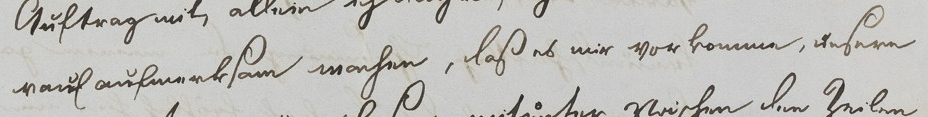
rauf aufmerksam machen, daß es mir vorkomme, unsere
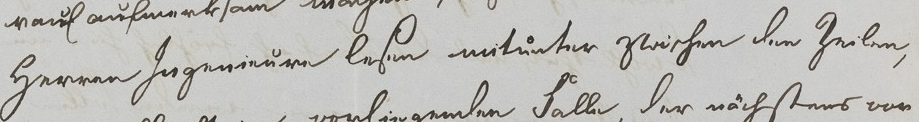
Herren Ingenieure lesen mitunter zwischen den Zeilen,
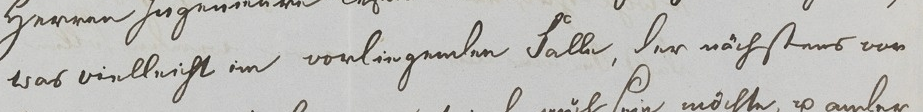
was vielleicht im vorliegenden Falle, der nächstens vor
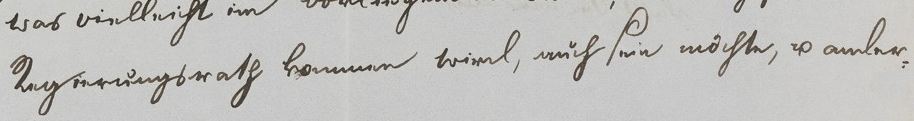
Regierungsrath kommen wird, auch sein möchte, & ander-
